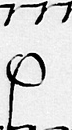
c.)
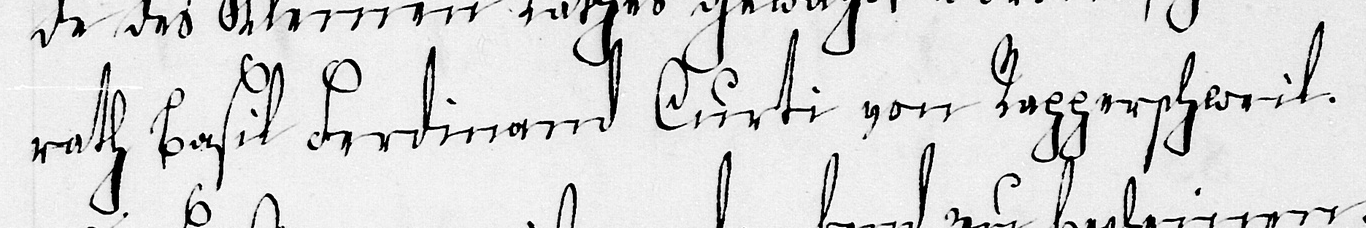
rath Basil Ferdinand Curti von Rapperschweil.
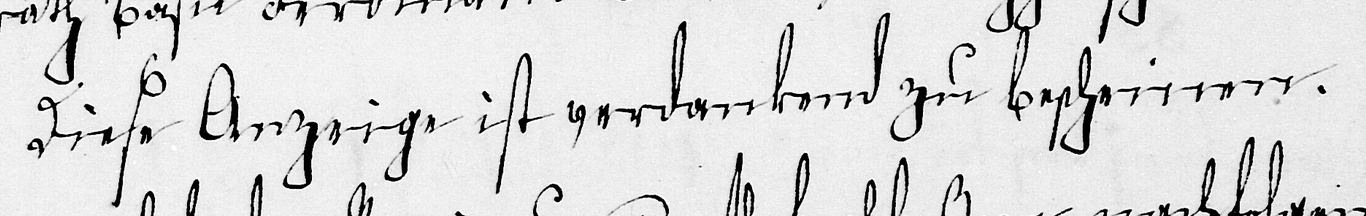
Diese Anzeige ist verdankend zu bescheinen.
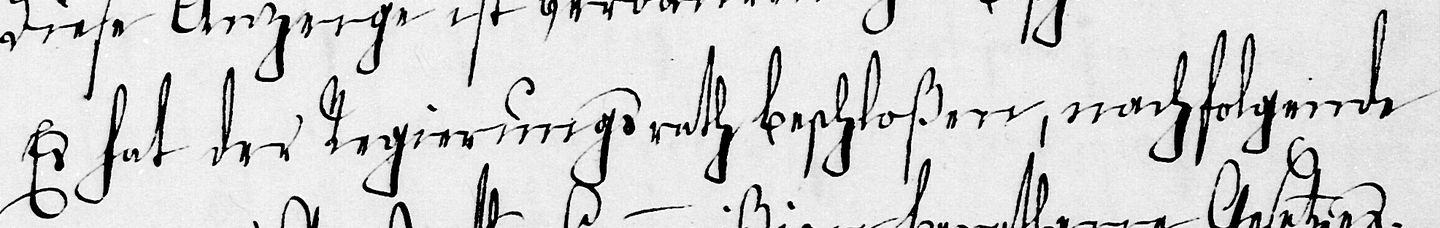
Es hat der Regierungsrath beschloßen, nachfolgende
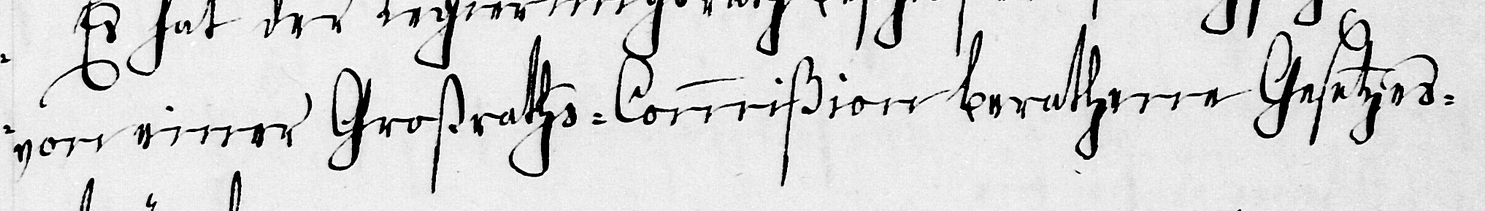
von einer Großraths-Commißion berathene Gesetzes¬
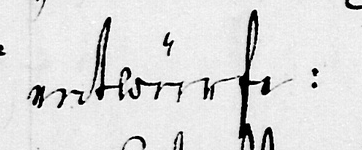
entwürfe:
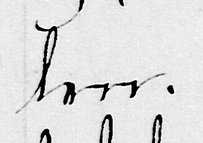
len.
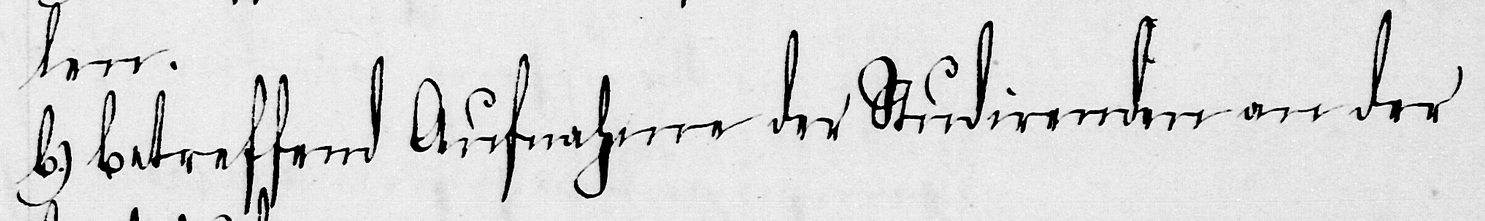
betreffend Aufnahme der Studirenden an der
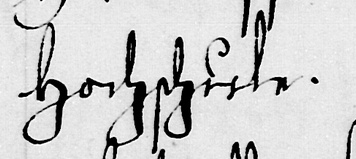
Hochschule.
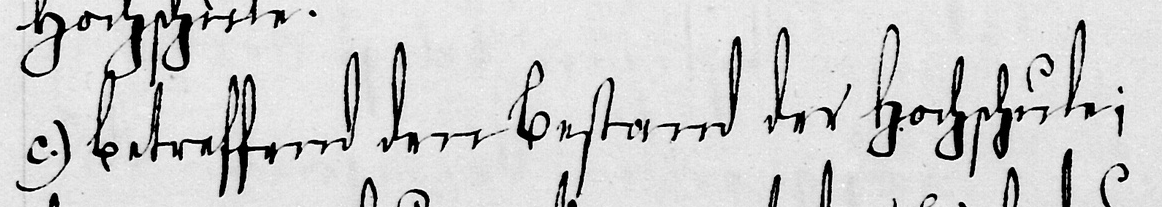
betreffend den Bestand der Hochschule;
